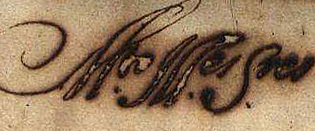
M.to Ill.es S.res
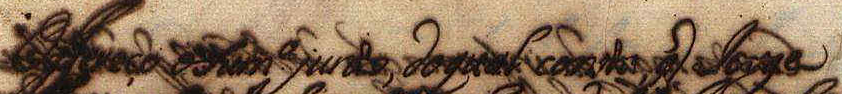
Offereço o sumo junto, do qual consta q̄ Iorge
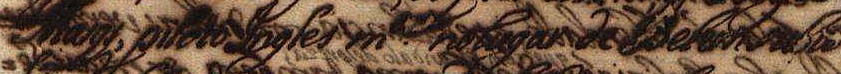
Masqs, piloto Ingles m._ no lugar de Belem _ubur
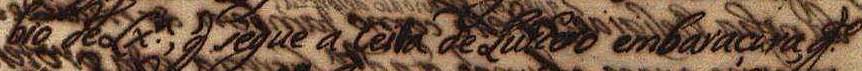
bio de Lx.a, q̄ segue a ceita de Luthero embaraçara q̄to
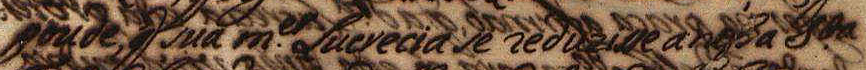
poude, q̄ sua m.er Lucrecia se reduzisse a nossa S.ta
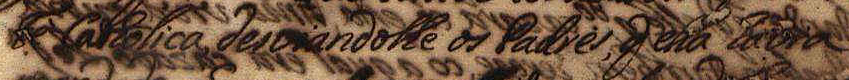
Fe Catholica desviandolhe os Padres, q̄ ella havia
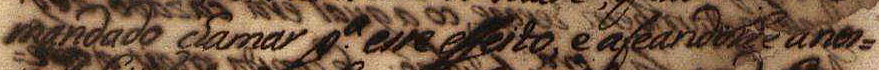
mandado chamar p.a esse effeito, e afeandolhe a nos
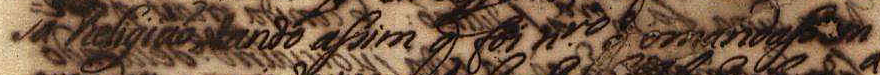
sa Religiaõ tanto assim q̄ foi n.ro q̄ o mandas_n
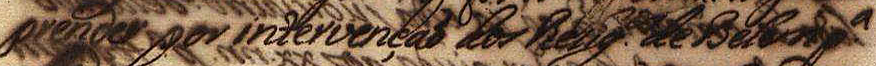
prender por intervençaõ dos Relig.zos de Belem p.a
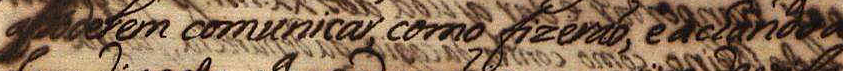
a poderem comunicar como fizeraõ, e achandoa
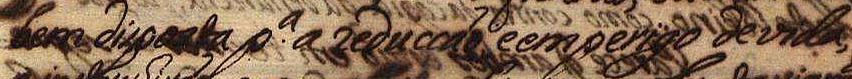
bem disposta p.a a reducçaõ, e em perigo de vida,
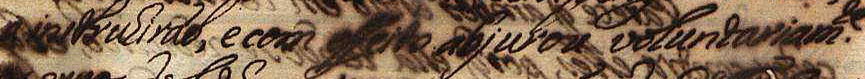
a instruhiraõ, e com effeito abjurou voluntariam.te
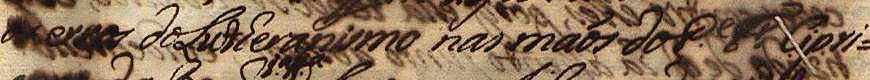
os erros do Lutheranismo nas maõs do P.e Fr. Cipri
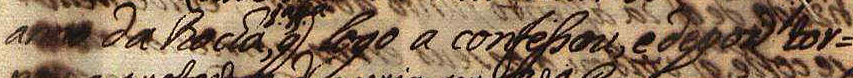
anno da Rocha, q̄ logo a confessou, e depois tor
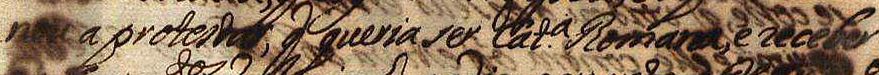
nou a protestar, q̄ queria ser Cat.a Romana, e receber
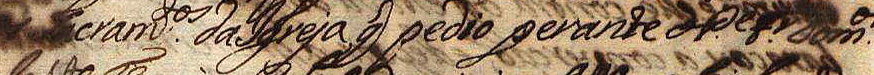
os sacram.tos da Igreja, q̄ pedio perante o P.e F.r Dom.os
